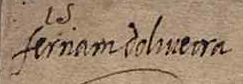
fernam doliueira
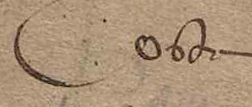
Costa
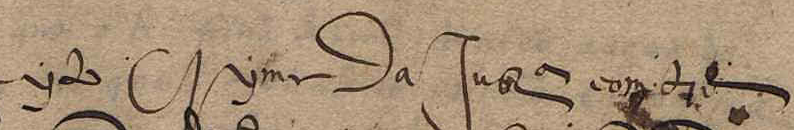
feyto Cryme da Justa comtra
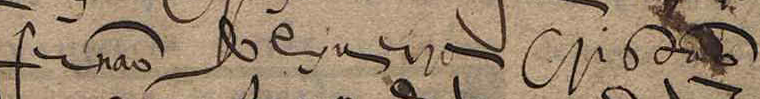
fernão dolyueira Cristão
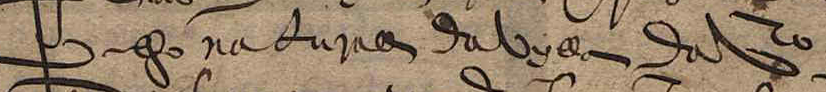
velho naturall da vylla davro
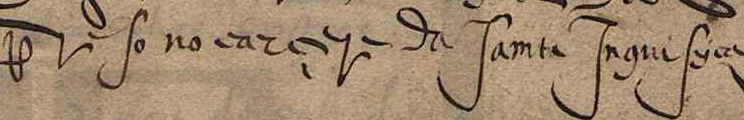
preso no carçere da samta Jnquisyça
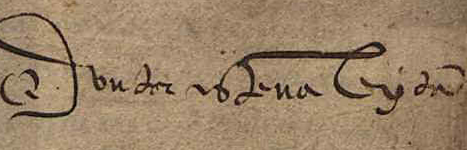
O doutor esteuā leytā
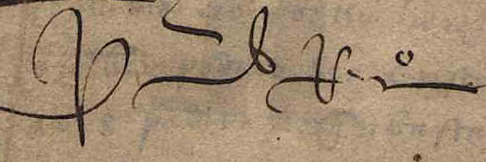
P̄dor do Reeo
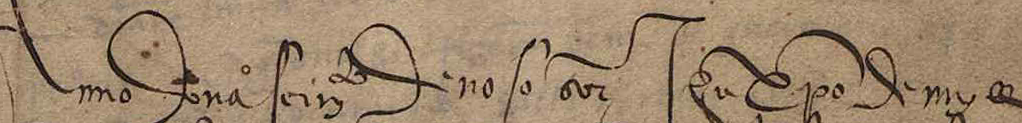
Anno do nascimto de noso s̄or Jhū xp̄o de myll
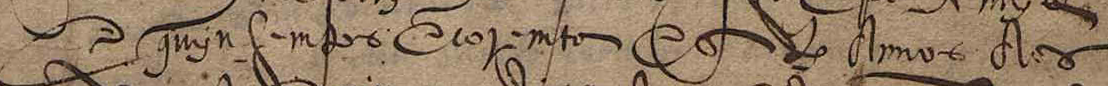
e quynhemtos e coremta e setꝭ Annos Aos
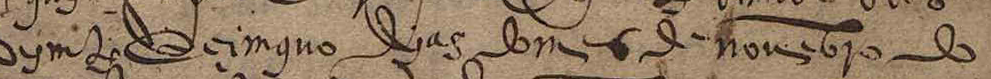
vymte e çimquo dyas do mes de nouēbro do
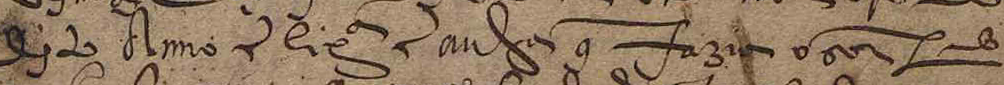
dyto Anno ē lixa e audja q̄ fazia o s̄or Ldo
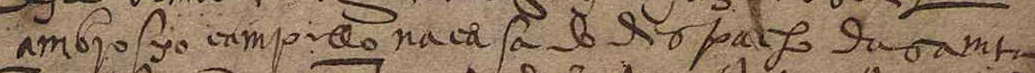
ambrosyo campello na casa do despacho da samta
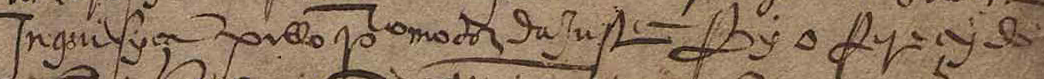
Jnquisyçā pello promotor da Justa foy ofereçydo
